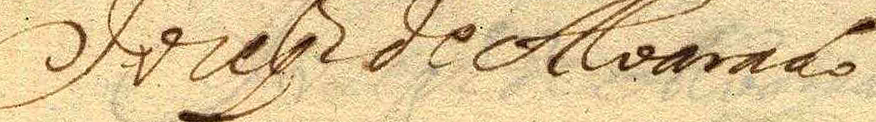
Jozeph de Alvarado
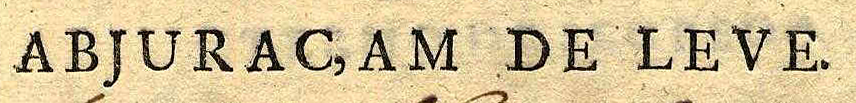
ABJURAÇAM DE LEVE.
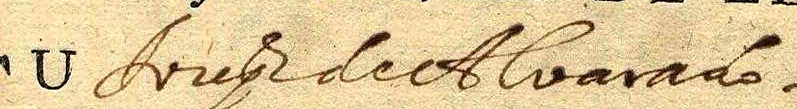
U Iozeph de Alvarado
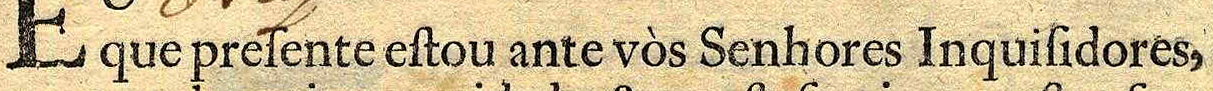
E que presente estou ante vòs Senhores Inquisidores,
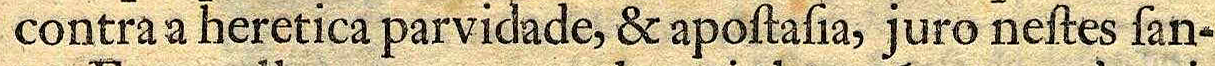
contra a heretica parvidade, & apostasia, juro nestes san
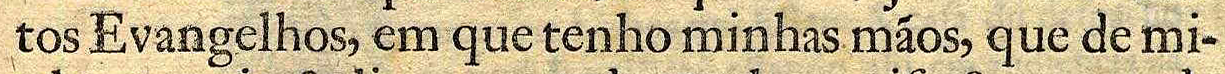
tos Evangelhos, em que tenho minhas mãos, que de mi
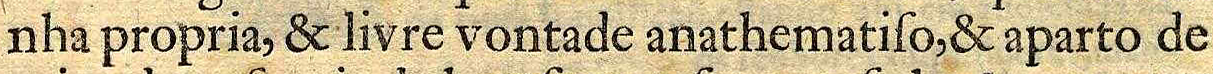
nha propria, & livre vontade anathematiso, & aparto de
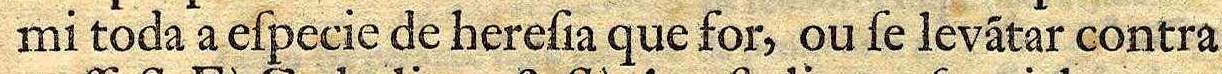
mi toda a especie de heresia que for, ou se levātar contra
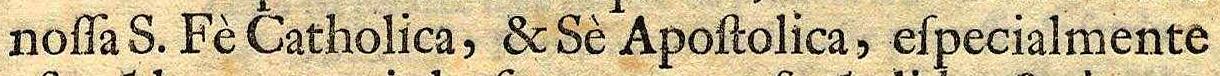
nossa S. Fè Catholica, & Sè Apostolica, especialmente
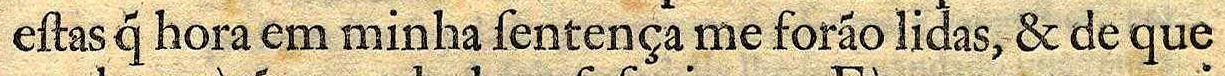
estas q̄ hora em minha sentença me forão lidas, & de que
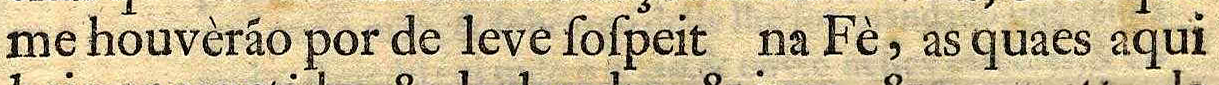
me houverão por de leve sospeit na Fè, as quaes aqui
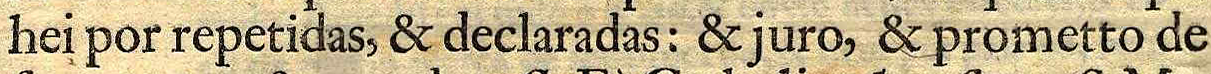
hei por repetidas, & declaradas: & juro, & prometto de
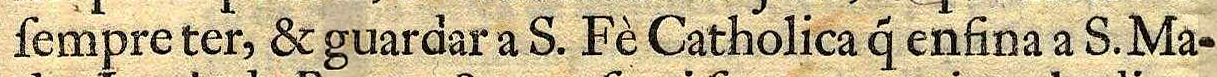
sempre ter, & guardar a S. Fè Catholica q̄ ensina a S. Ma
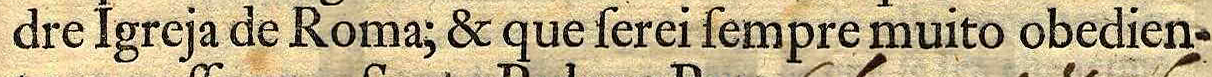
dre lgreja de Roma; & que serei sempre muito obedien
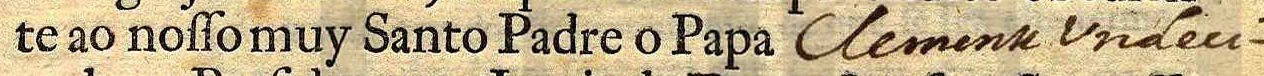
te ao nosso muy Santo Padre o Papa Clemente Vndeci
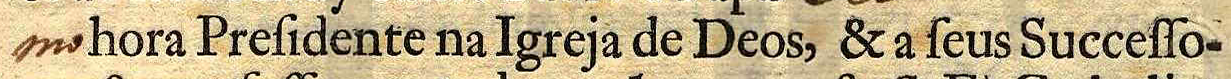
mo hora Presidente na lgreja de Deos, & a seus Successo
